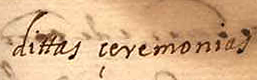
dittas çeremonias
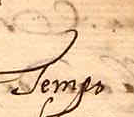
Tempo
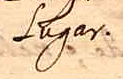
Lugar.
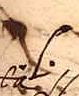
.L.
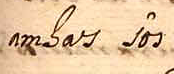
ambas sós
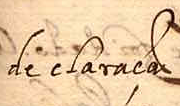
declaraçaõ
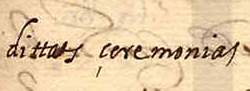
dittas çeremonias
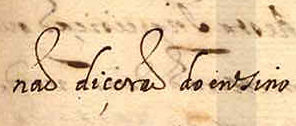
naõ diçeraõ do ensino
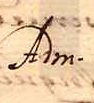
Adm.
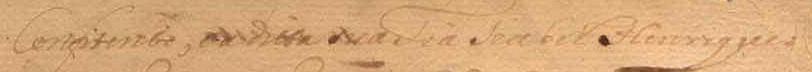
Confitente, e a ditta sua Tia Izabel Henriques
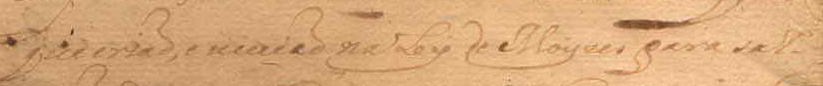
que criaõ, e uiuiaõ na Ley de Moyzes para sal
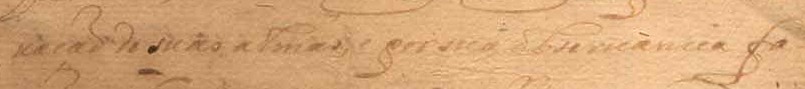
uaçaõ de suas almas, e por sua obseruancia fa
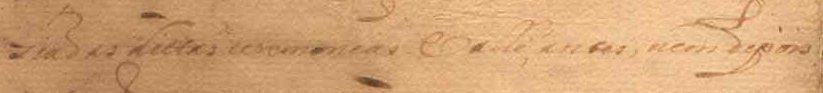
ziaõ as dittas ceremonias e alli, antes, nem depois
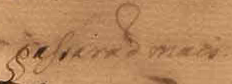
passaraõ mais.
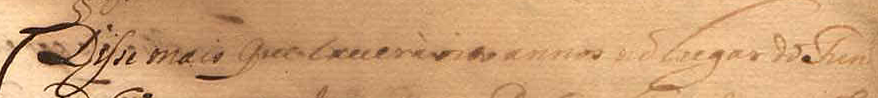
Disse mais que hauerà oito annos no lugar do Fun
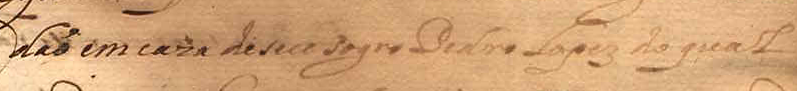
daõ em caza de seu sogro Pedro Lopez do qual
